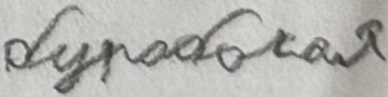буробокая
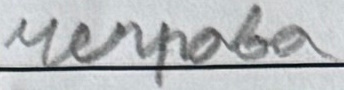чегрова
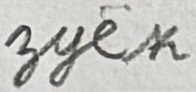зуёк
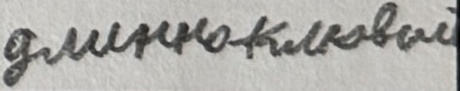длинноклювый
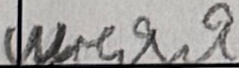синяя
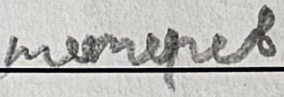тетерев
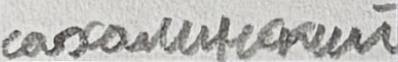сахалинский
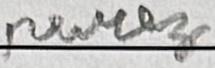ремез
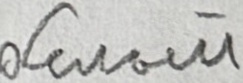белый
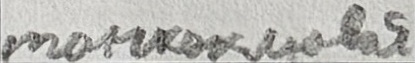тонкоклювая
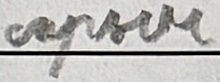сарыч
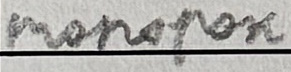топорок
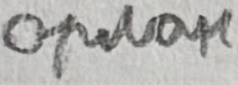орлан
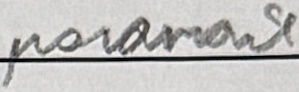рогатая
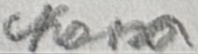скопа
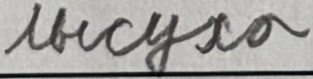лысуха
